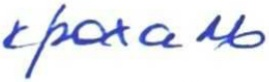крохаль
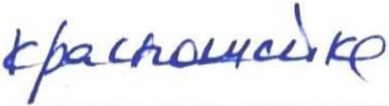красношейка
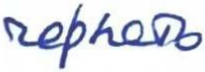черпеть
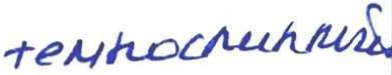темноспинный
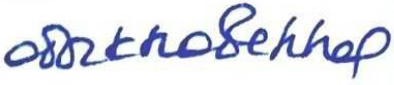обыкновенное
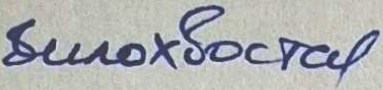вилохвостая
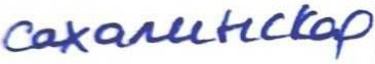сахалинская
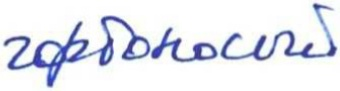горбоносый
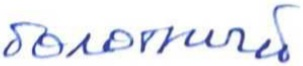болотный
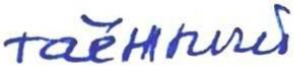таёжный
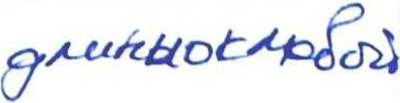длинноклювый
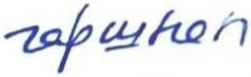гаршнеп
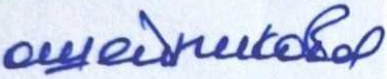ошейниковя
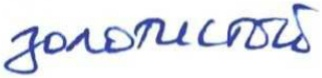золотистый
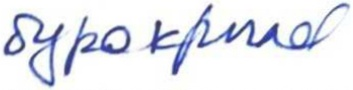бурокрылая
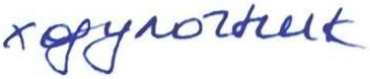ходулочник
